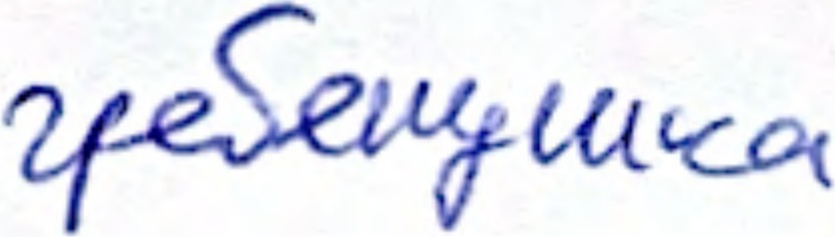гребенушка
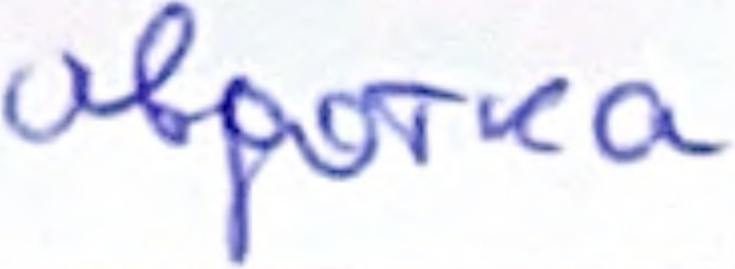авдотка
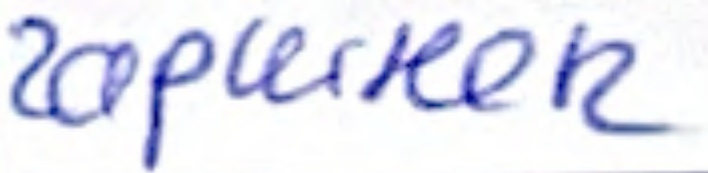гаршнеп
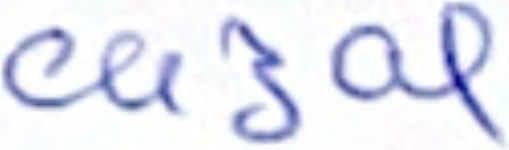сизая
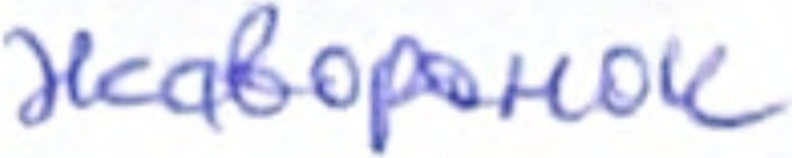жаворонок
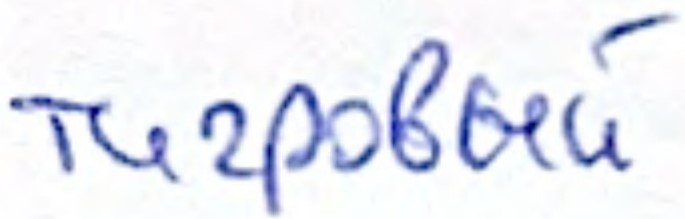тигровый
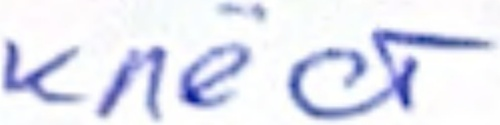клёст
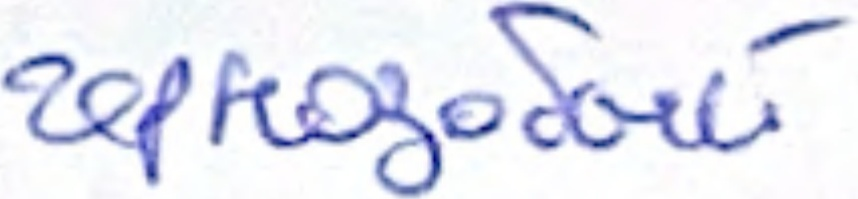чернозобый
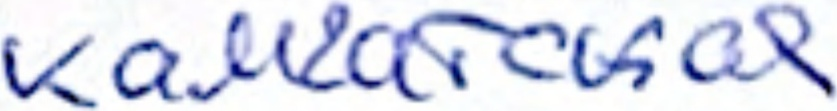камчатская
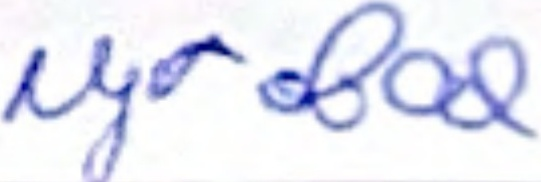луговая
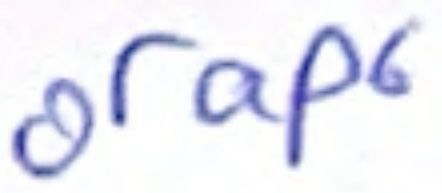огарь
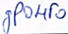дронго
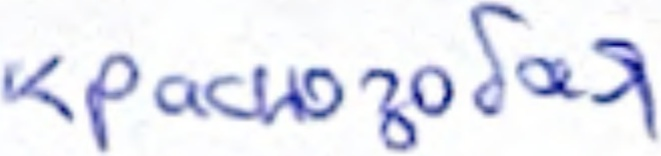краснозобая
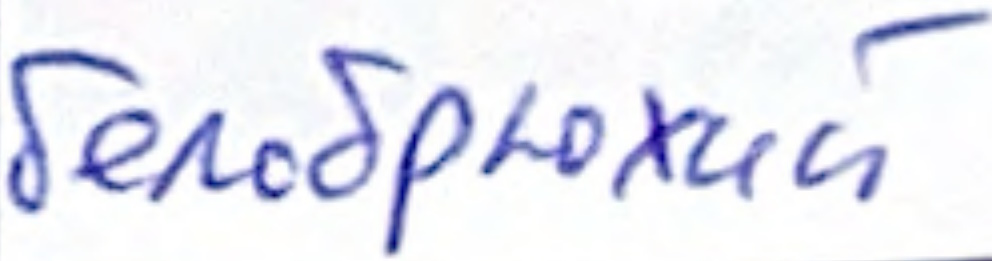белобрюхий
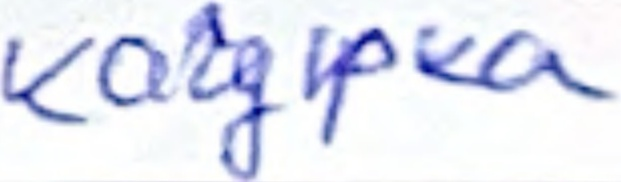качурка
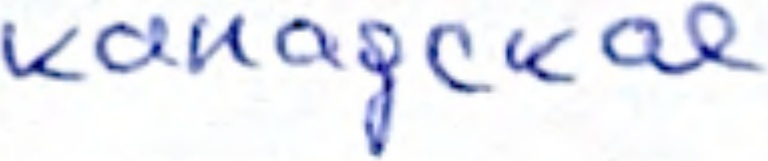канадская
